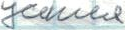цапля
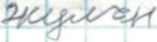жулан
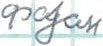фазан
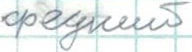средний
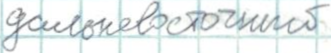дальневосточный
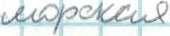морская
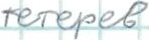тетерев
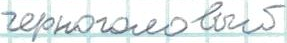черноголовый
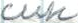сип
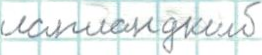лапландкий
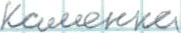каменка
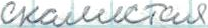скалистая
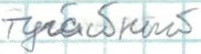тугайный
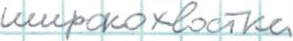широкохвостка
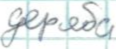деряба
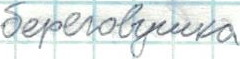береговушка
